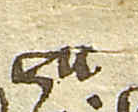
cʒu
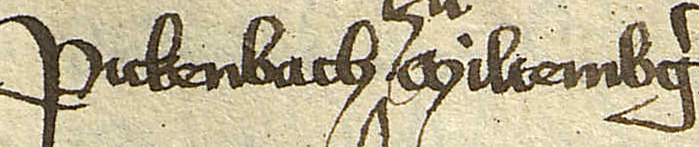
Pickenbach Miltembg*
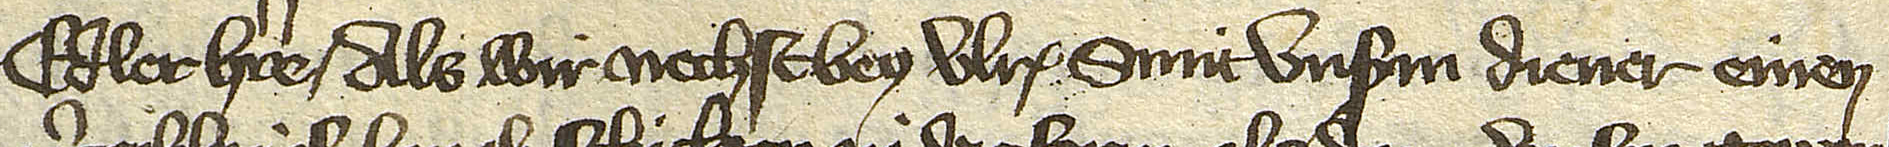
Edler h*re / Als wir nechſt bey vlr* Smit vnſ*m diener einen
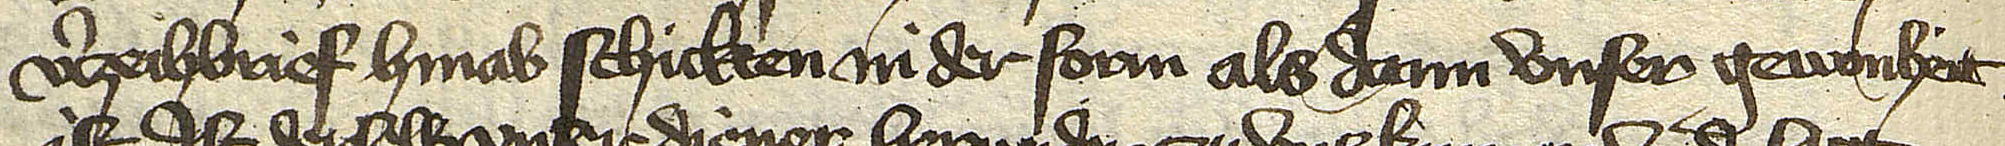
v*cʒeihbrief hinab ſchickten in der form als dann vnſer gewonheit
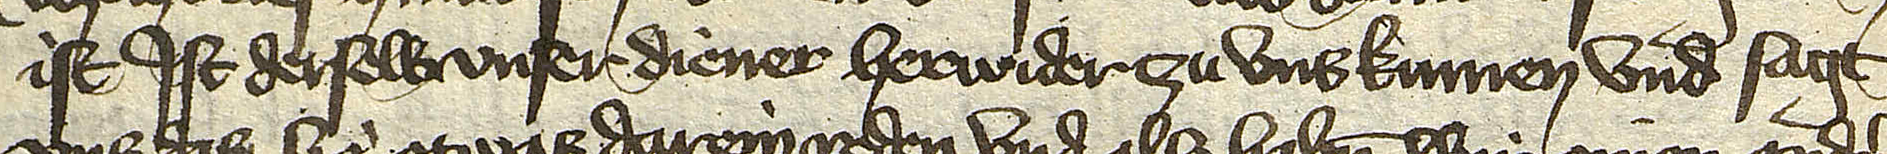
iſt Iſt derſelb vnſer diener herwider cʒu vns kumen vnd ſagt
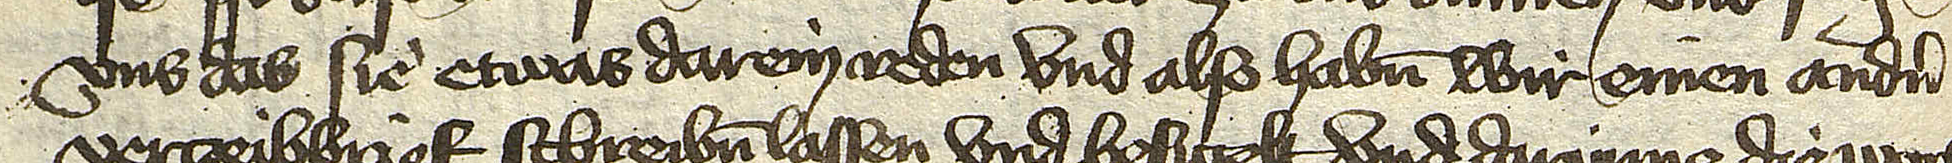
vns das ſie etwas darein reden vnd alſo habn* wir einen andn*
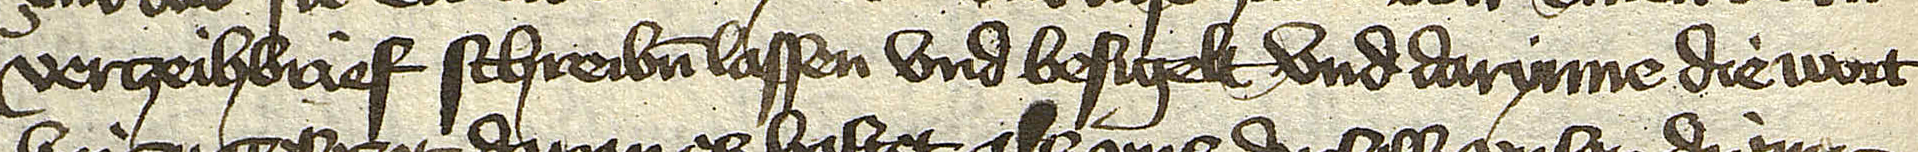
vercʒeihbrief ſchreibn* laſſen vnd beſigelt vnd darynne die wort
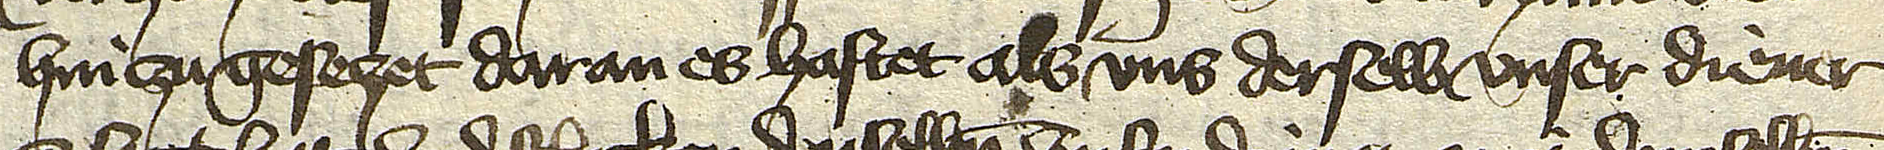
hincʒu geſecʒet daran es haftet als vns derſelb vnſer diener
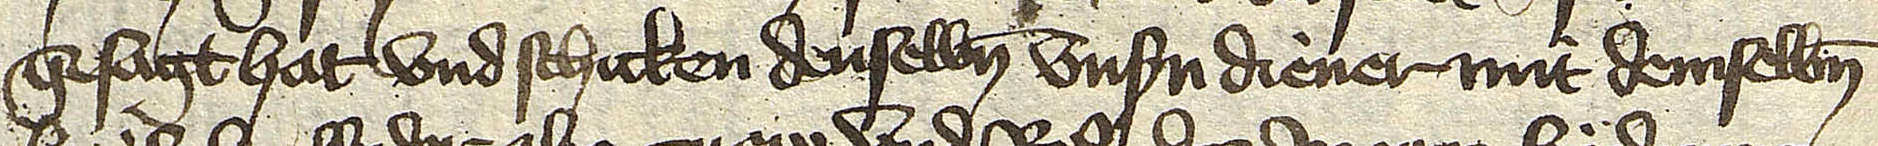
geſagt hat vnd ſchicken denſelbn* vnſ*n diener mit demſelbn*
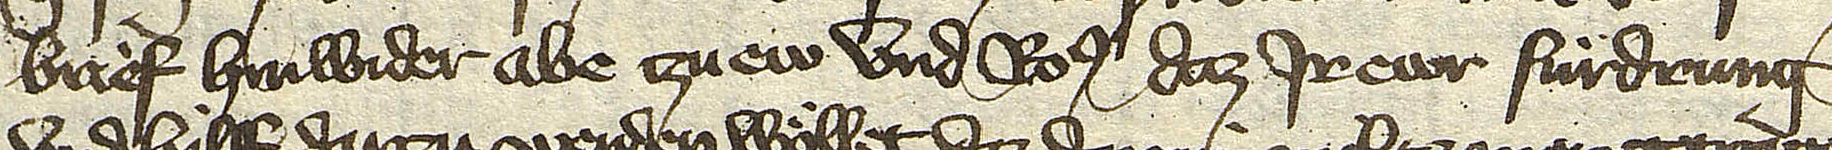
brief hinwider abe cʒu ew vnd Ro* daʒ Ir ewr fürdrung
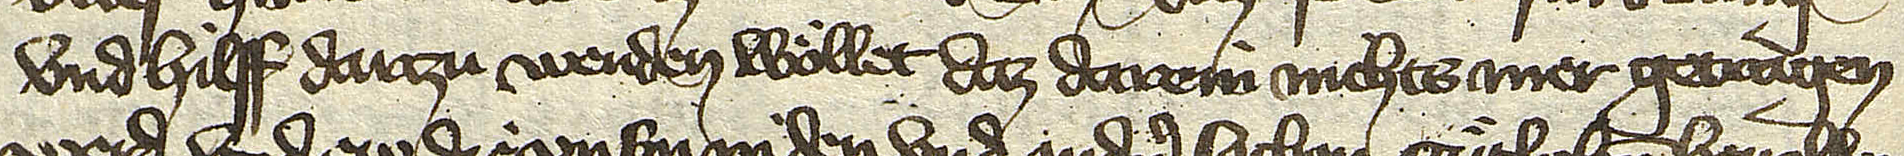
vnd hilff darcʒu werden wöllet daʒ darein nichts mer getragen
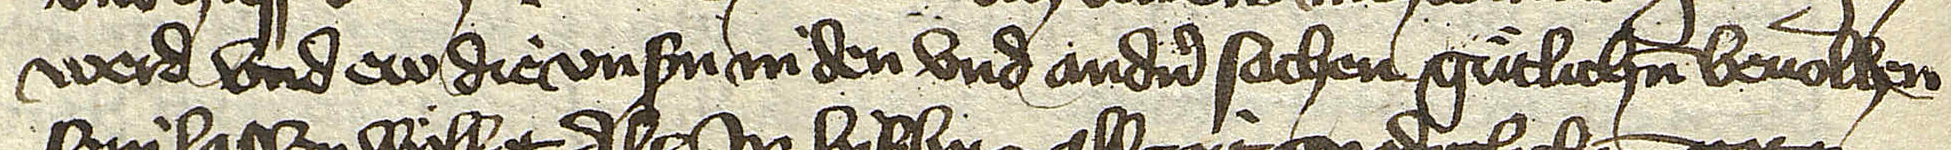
werd vnd ew die vnſ*n in den vnd andn* ſachen gütlichn* beuolhen
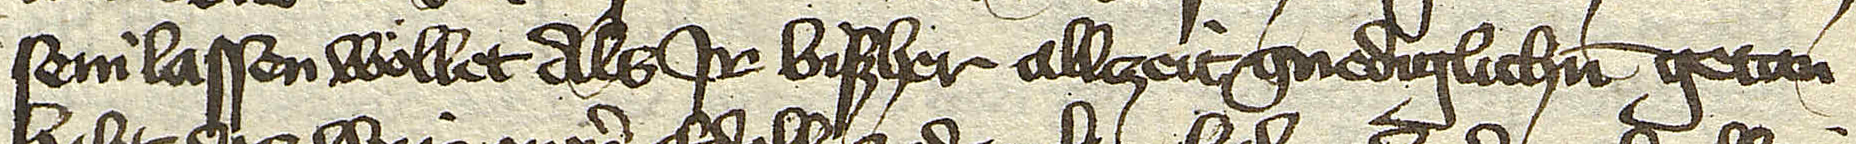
ſein laſſen wöllet Als Ir biſʒher allcʒeit gnediglichn* getan
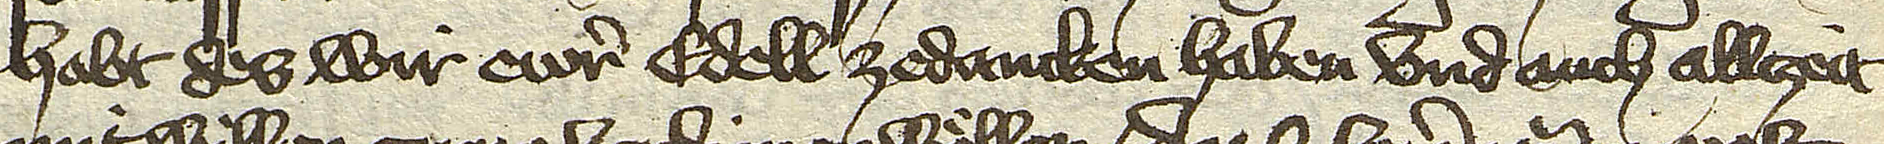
habt des wir ewr* Edell ʒedancken haben vnd auch allcʒeit
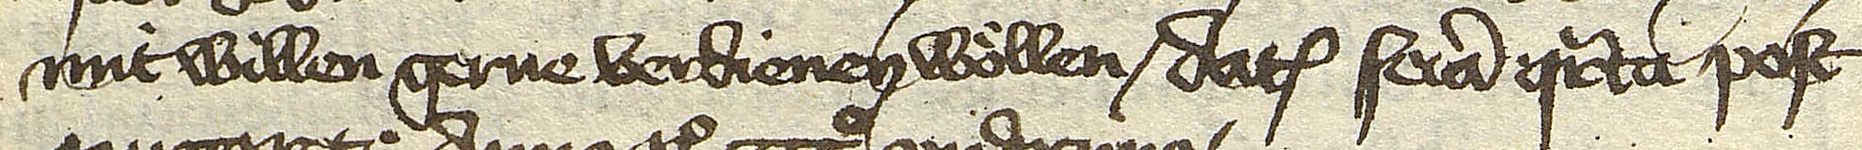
mit willen gerne verdienen wöllen / dat* feia* qrta* poſt
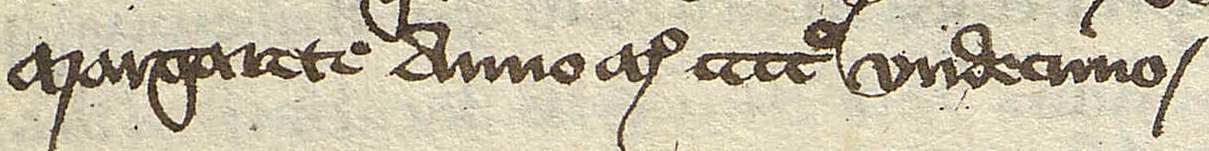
Margarete Anno M* cccc* vndecimo /
